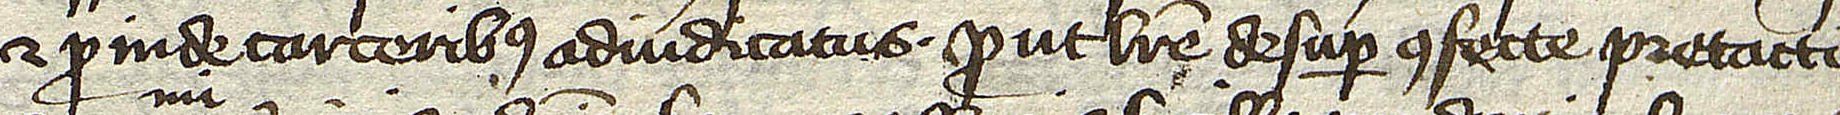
@ p*inde carcerib* adiucatus . P*ut l*re deſup* *fecte pretacti
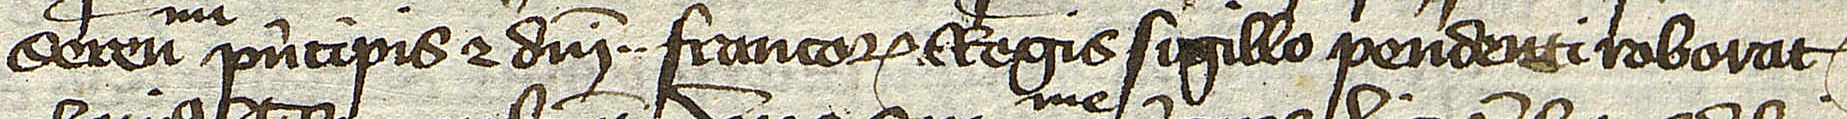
Seren* p*ncipis @ d*ni ~ Franco* Regis ſigillo pendenti roborat*
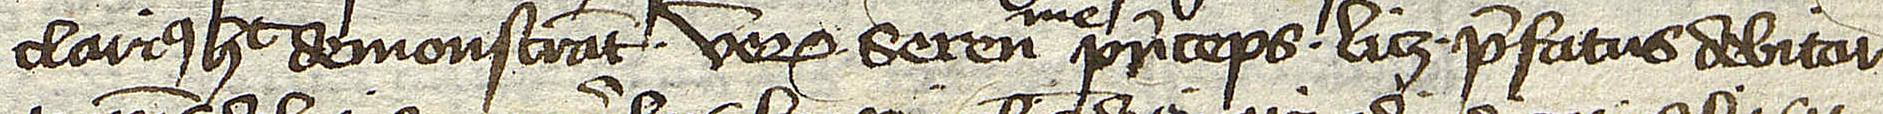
clari* h* demonſtra*t . Ve* Seren* p*nceps . Lic* p*fatus debitor
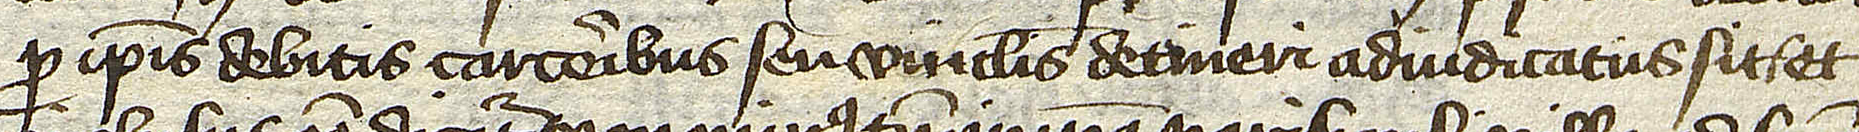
p* ip*is debitis carce*ibus ſeu vinc*lis detineri adiucatus ſit et
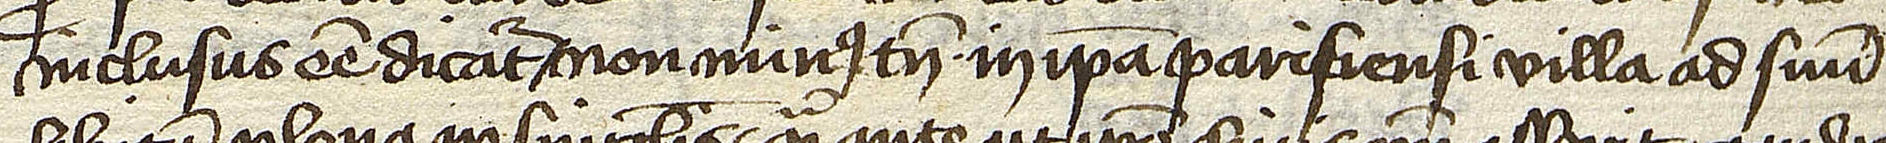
incluſus e*e dicat* / Non min* t*n . in ip*a Pariſienſi villa ad ſuu*
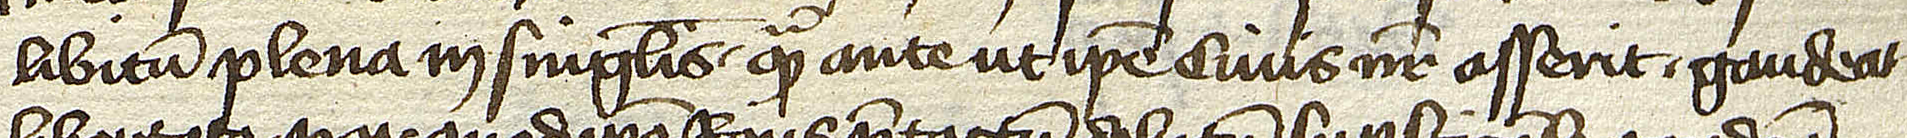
libitu* plena in ſing*lis / q* ante ut ip*e Ciuis n*r aſſerit / gaudeat
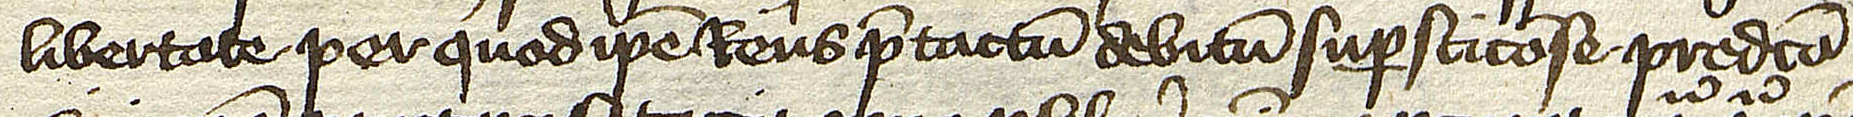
libertate per quod ip*e Reus p*tactu* debitu* ſup*ſtit*oſe pred*c*o
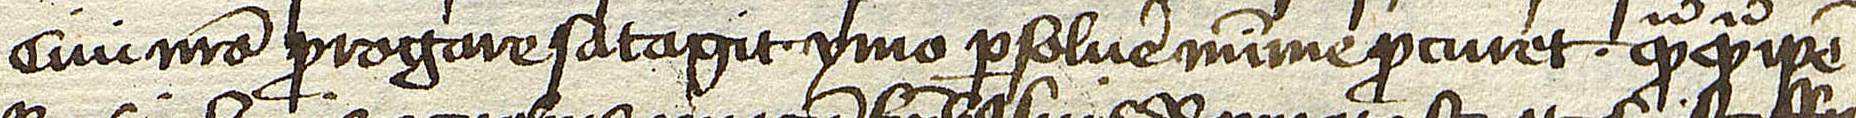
Ciui n*ro p*rogare fatigat . ymo p*ſolue* mi*me p*curet . q*q* ip*e
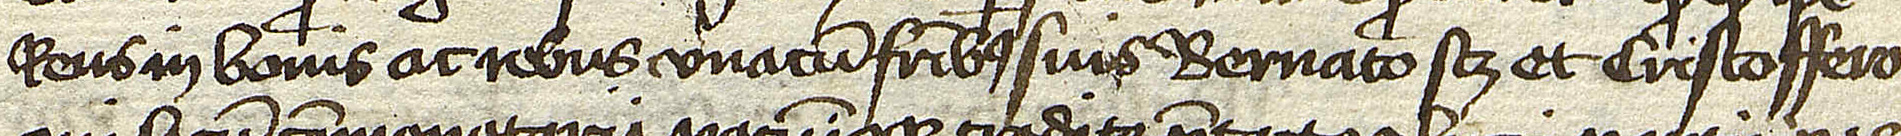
Reus in bonis ac rebus vnacu* f*rib* ſuis Bernato ſc* et Criſtoffero
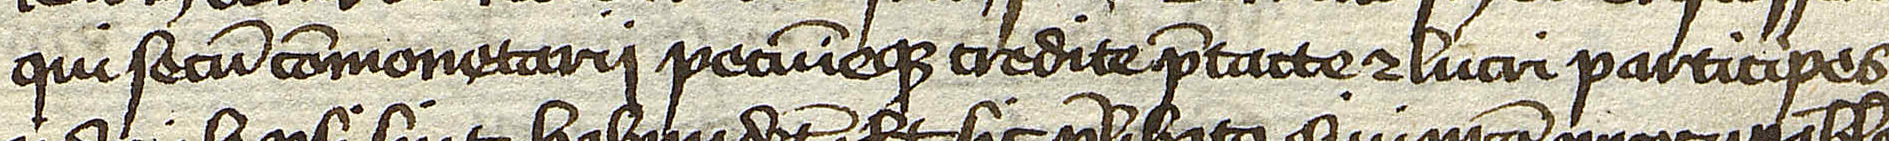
qui ſecu* com*onetarii pecu*ieq* credite p*tacte @ lucri participes
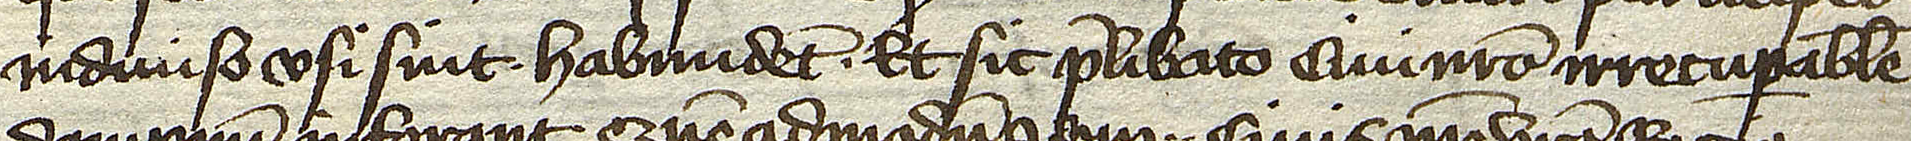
indiuiſo vſi ſint . habunde*t . Et ſic p*libato Ciui n*ro irrecupab*le
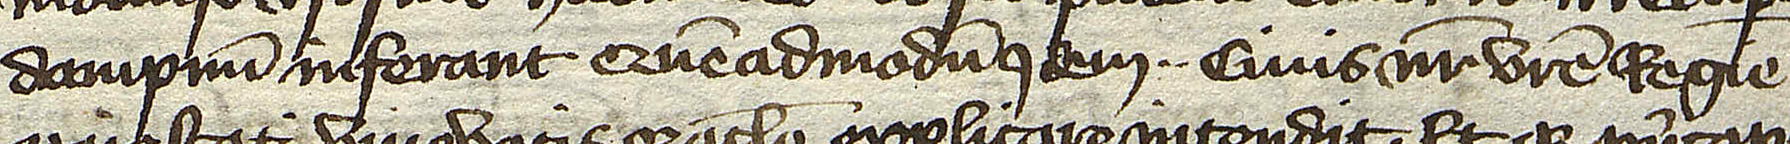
dampnu* inferant . Que*admodu* Idem ~ Ciuis n*r v*re Regie
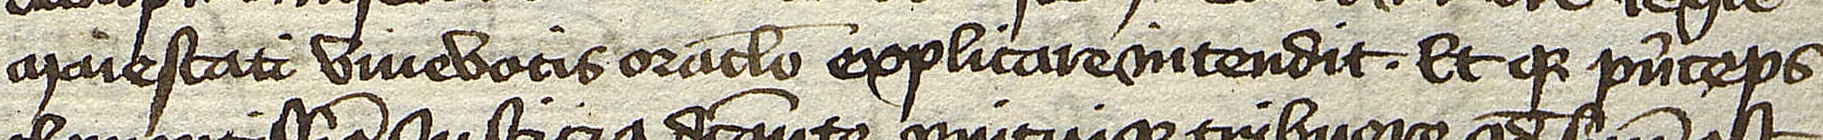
Maieſtati viuevocis orac*lo explicare intendit . Et q* p*nceps
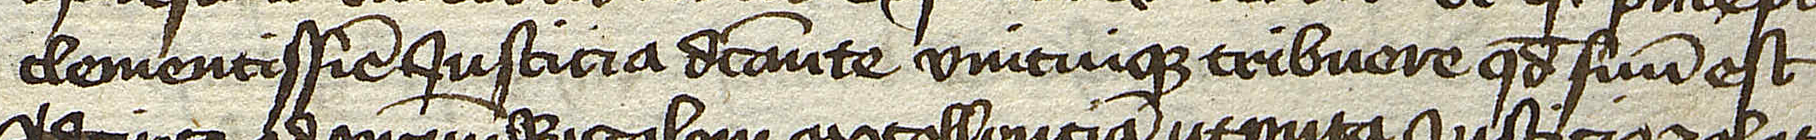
clementiſſi*e Iuſticia d*cante vnicuiq* tribuere q*d ſuu* eſt
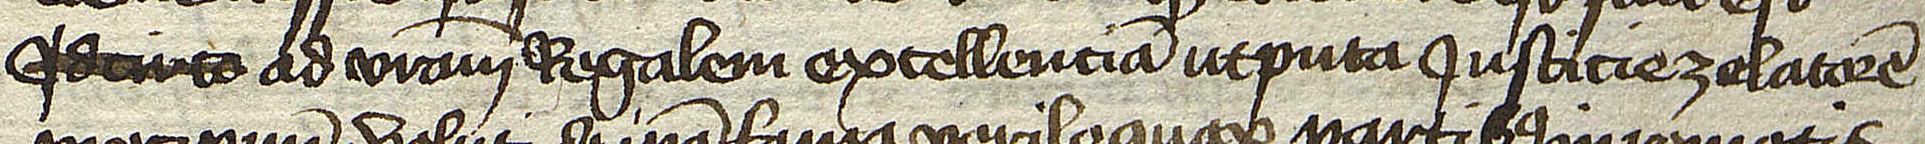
Idcirco Ad v*ram Regalem excellentia* ut puta Iuſticie ʒelatore*
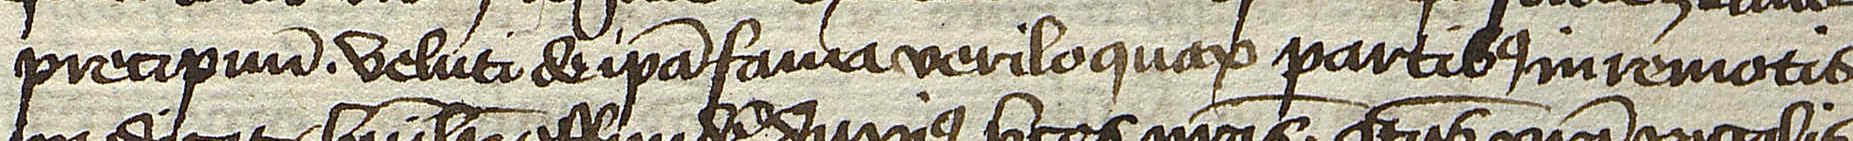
precipuu* . veluti de ip*a fama veriloquax partib* in remotis
